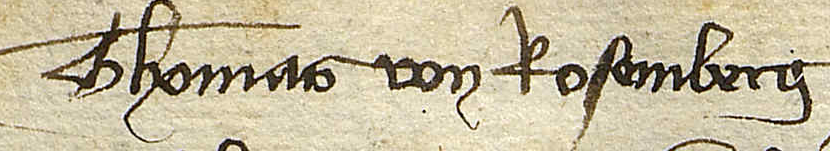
Thomas von Roſemberg
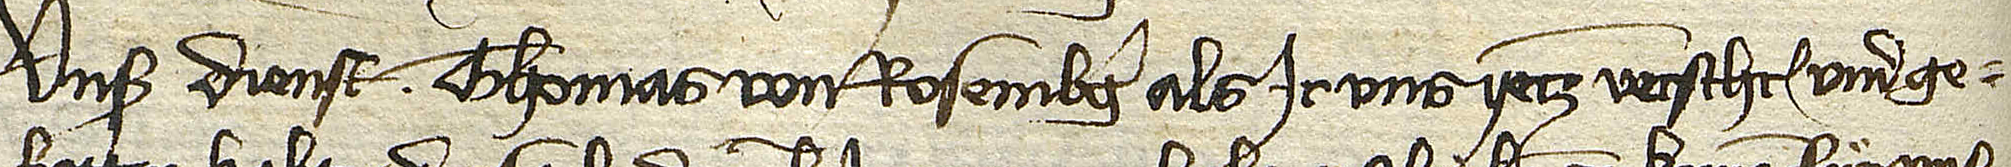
Vnſ* dienſt . Thomas von Roſemb*g als Ir vns yecʒ* verſchr* vnd ge =
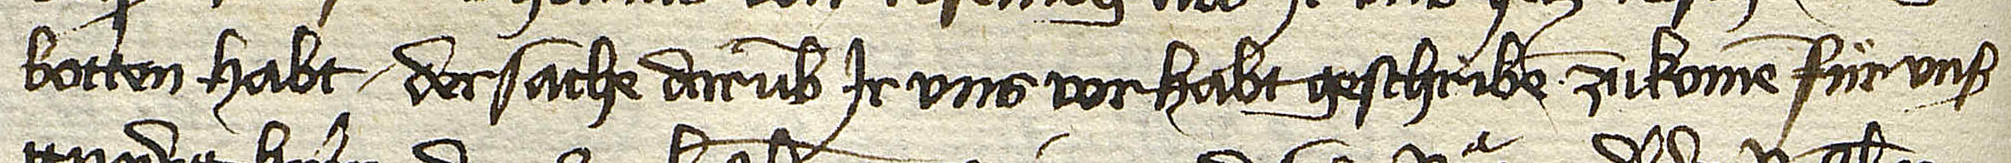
botten habt / der ſache daru*b Ir vns vor habt geſchribe* . ʒukome* für vnſ*
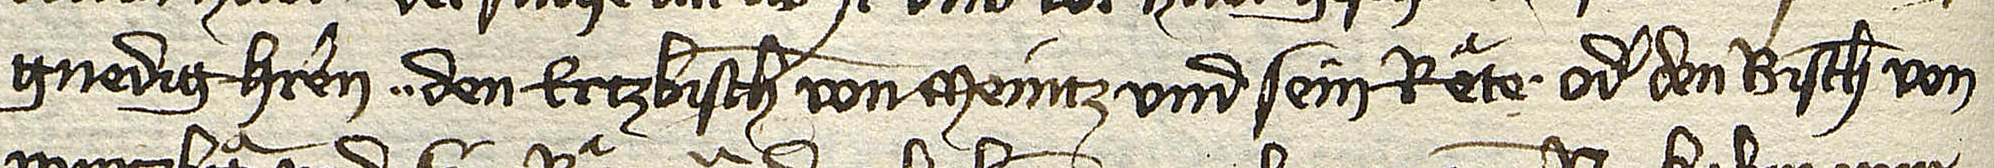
gnedig h*ren ~ den Ercʒbiſch* von Meincʒ vnd ſein Rëte . od* den Biſch* von
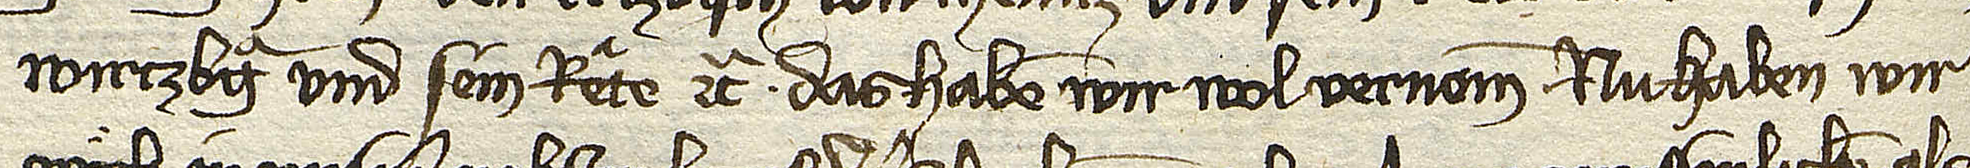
wircʒb*g vnd ſein Rëte ec* . das habe* wir wol vernom* . Nu haben wir
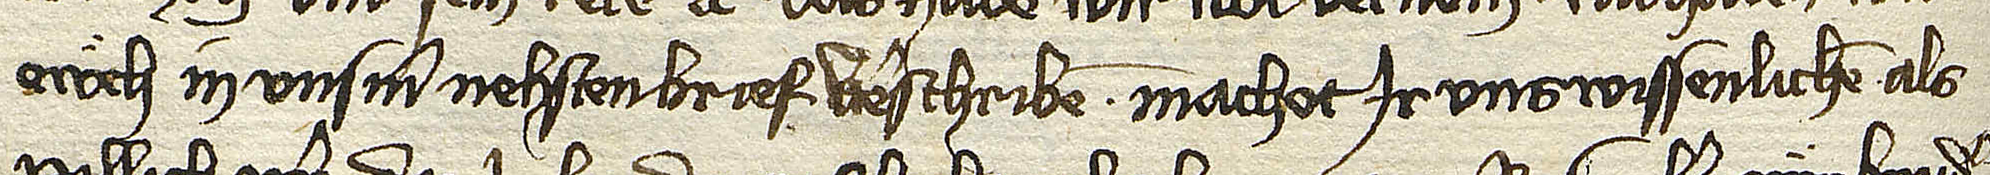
ewch in vnſ*m nehſten brief ve*ſchribe* . machot Ir vns wiſſenliche* . als
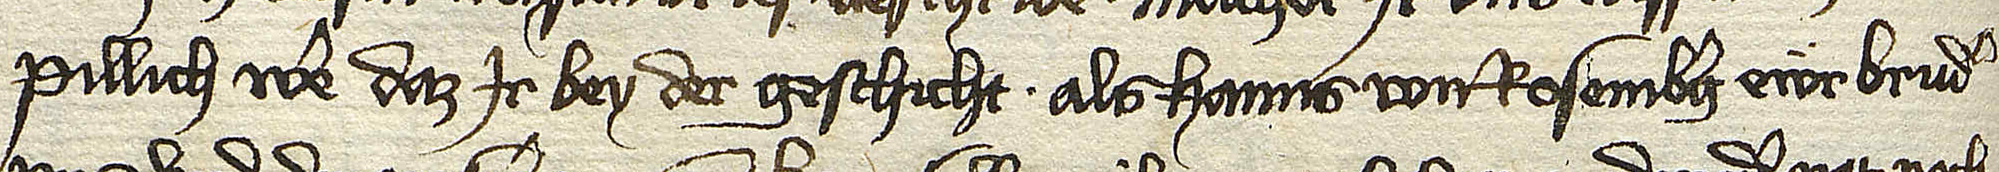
pillich we* daʒ Ir bey der geſchicht . als hanns von Roſemb*g ewr brud*
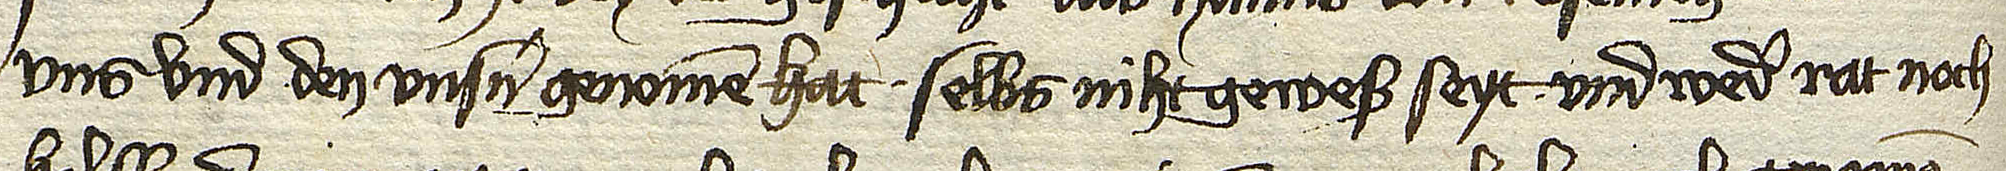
vns vnd den vnſ*n genome* hat . ſelbs niht geweſ* ſeyt . vnd wed* rat noch
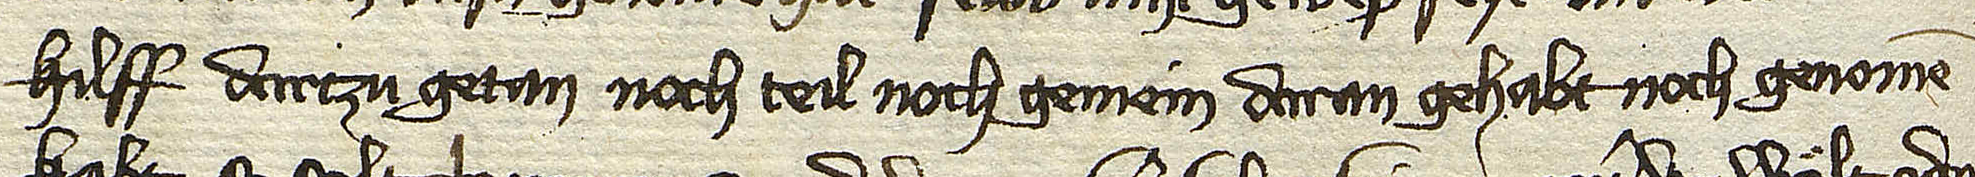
hilff darcʒu getan noch teil noch gemein daran gehabt noch genome*
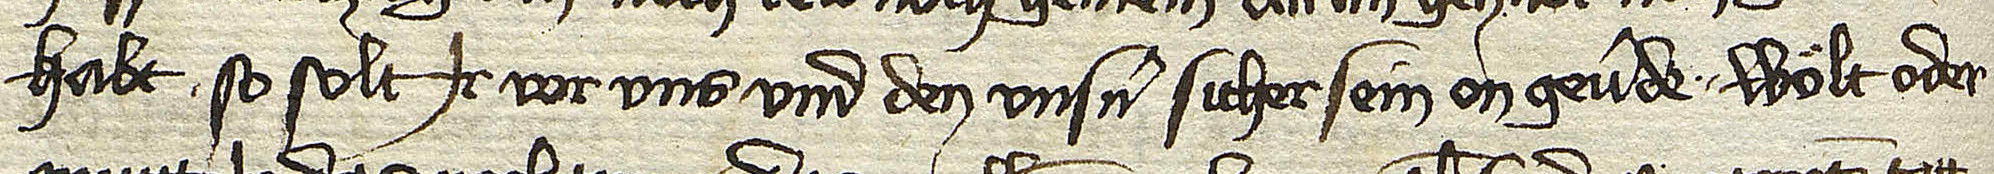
habt . ſo ſolt Ir vor vns vnd den vnſ*n ſicher ſein on geu*de . / Wölt oder
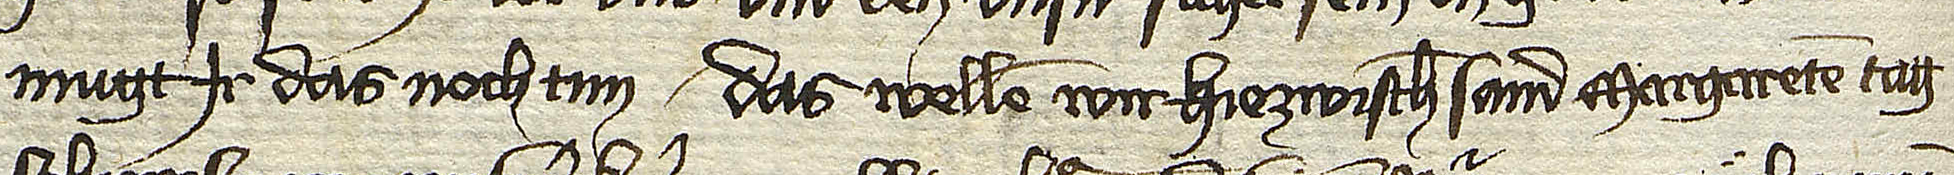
mugt Ir das noch tun / das welle* wir hieʒwiſch* ſand Margarete* tag
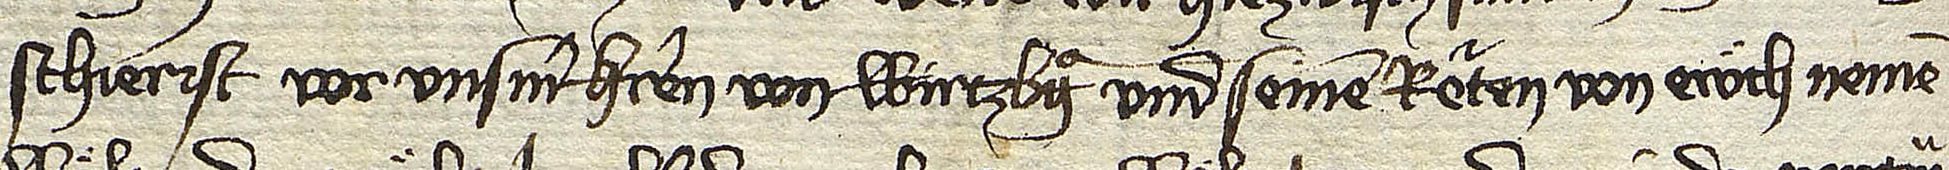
ſchieriſt vor vnſ*m h*ren von Wircʒb*g vnd ſeine* Rëten von ewch neme*
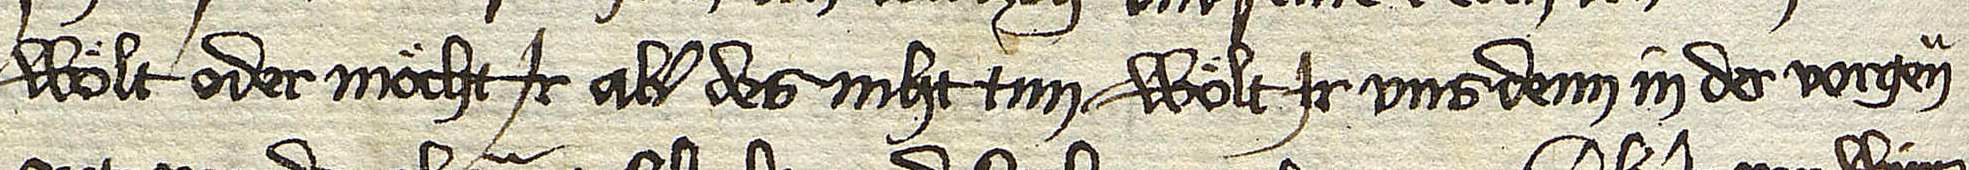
Wölt oder möcht Ir ab* des niht tun / Wölt Ir vns denn in der vorgen*
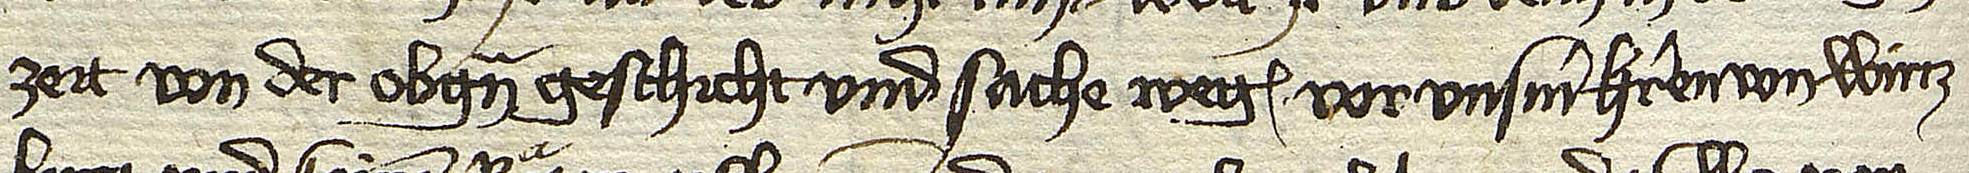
ʒeit von der obg*n geſchicht vnd ſache weg* vor vnſ*m h*ren von Wircʒ
